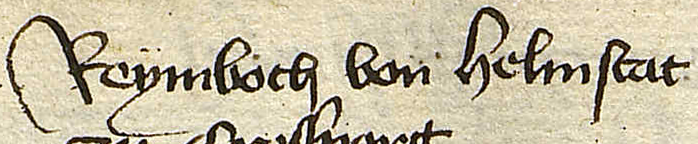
Reymboth von Helmſtat
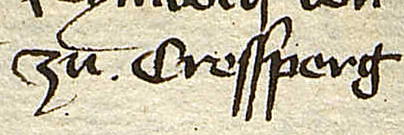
cʒu Creſſperg
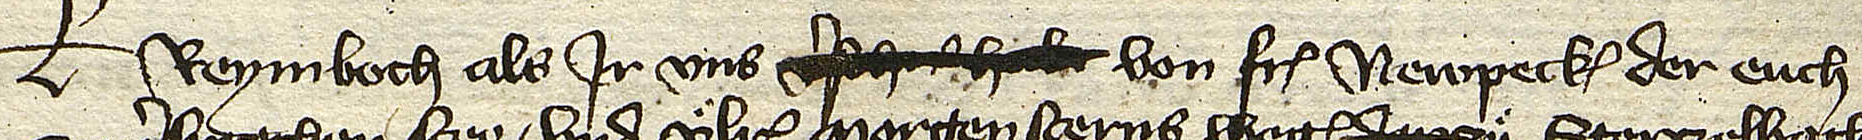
L* Reymboth als Ir vns v*ſchr* habt von fr* Newpeck* der euch
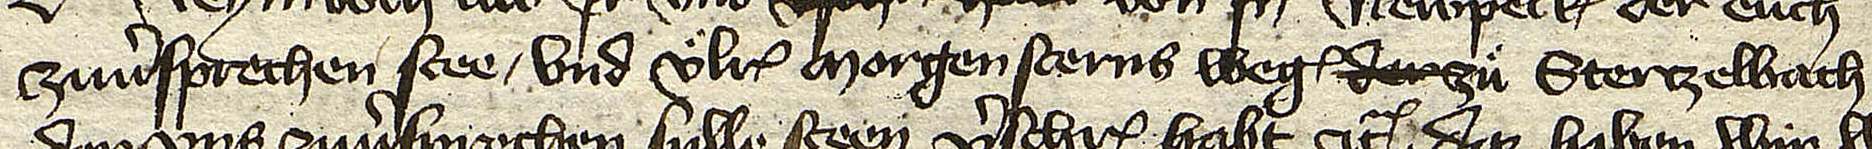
ʒuu*ſprechen ſtee / vnd v̈lr* Morgenſterns weg* der ʒü Stercʒelbach
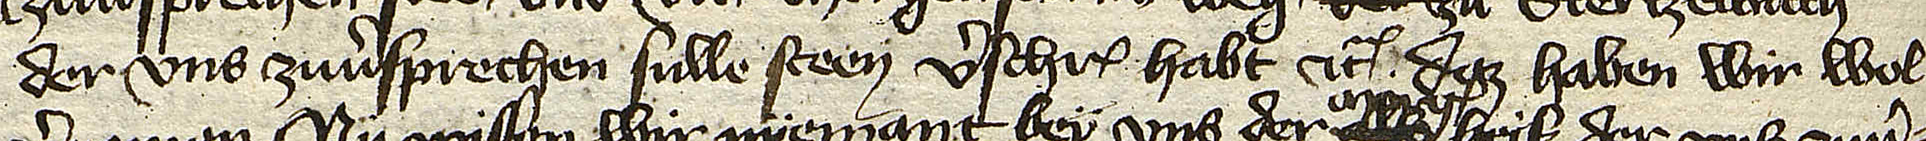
der vns ʒuu*ſprechen ſulle ſteen v*ſchr* habt ec* . daʒ haben wir wol
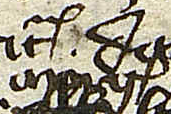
Morg*
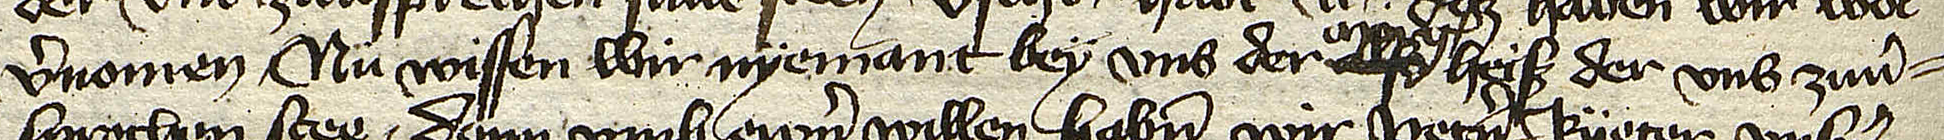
v*nomen / Nu wiſſen wir nyemant bey vns der alſo heiſʒ der vns ʒuu* =
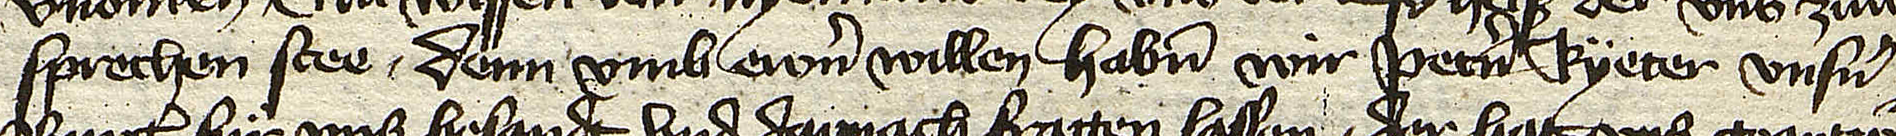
ſprechen ſtee / Denn vmb ew*n willen hab*n wir pet*n Ryeter vnſ*n
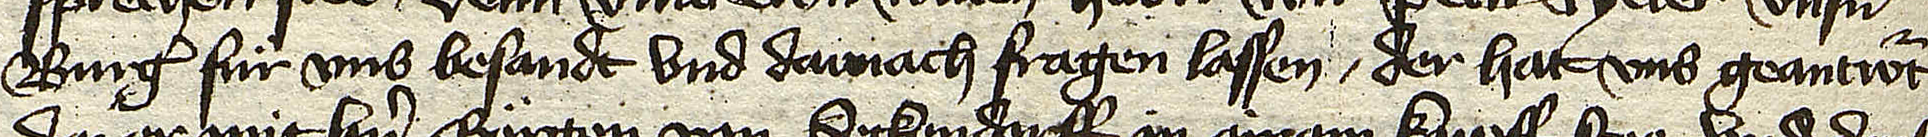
Burg* für vns beſandt vnd darnach fragen laſſen / der hat vns geantw*t
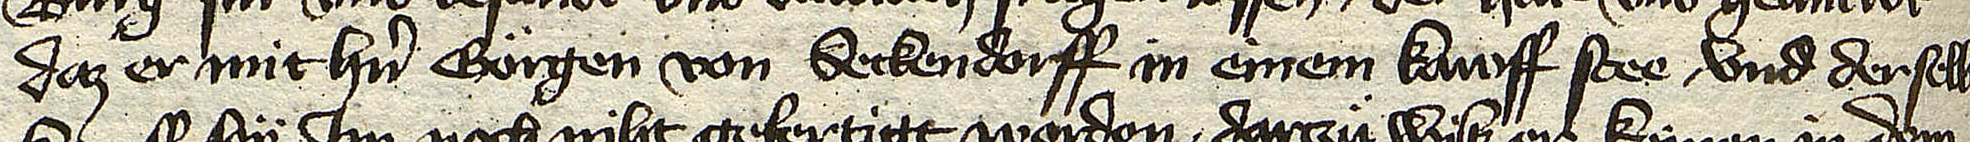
daʒ er mit h*n Görgen von Seckendorff in einem kawff ſtee / vnd derſelb
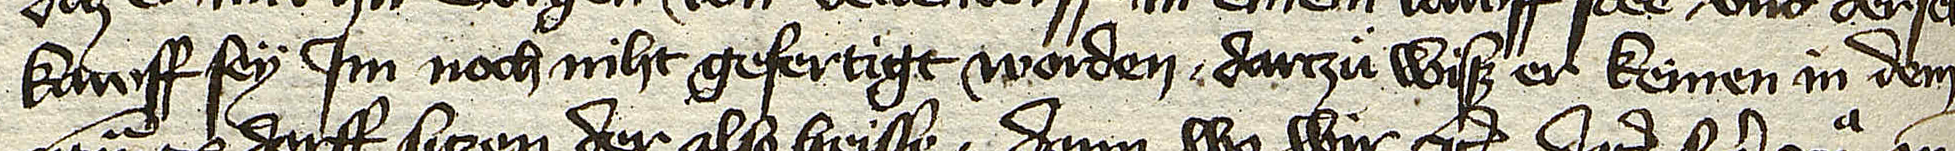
kawff ſey Im noch niht gefertigt worden / darcʒü wiſʒ er keinen in dem
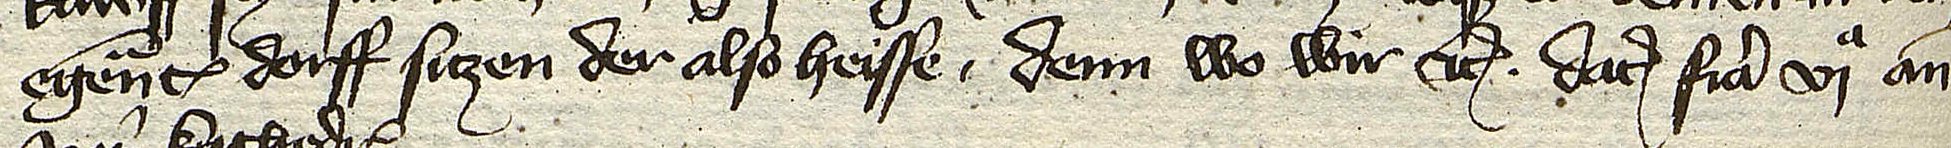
egent* dorff ſicʒen der alſo heiſſe / Denn wo wir ec* . dat* f*ia vi* an*
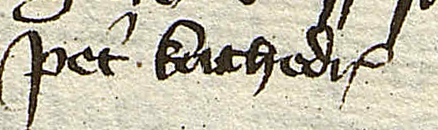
pet* . kathedr*
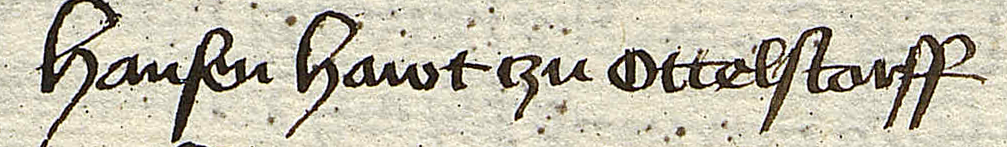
Hanſen Hawt cʒu Ottelſtorff
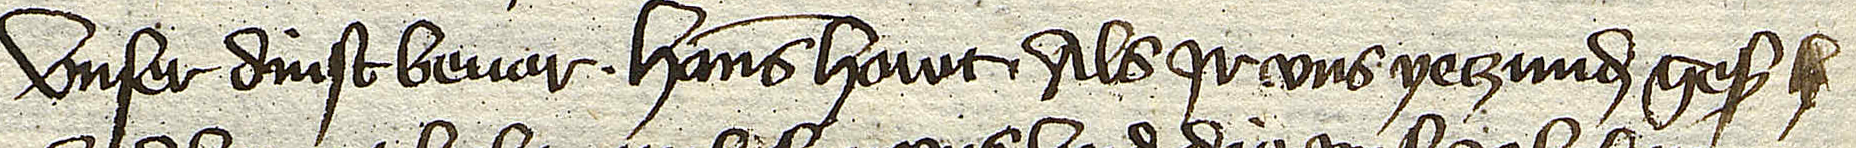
Vnſer dinſt beuor . hans* hawt . Als Ir vns yecʒund* geſ* h
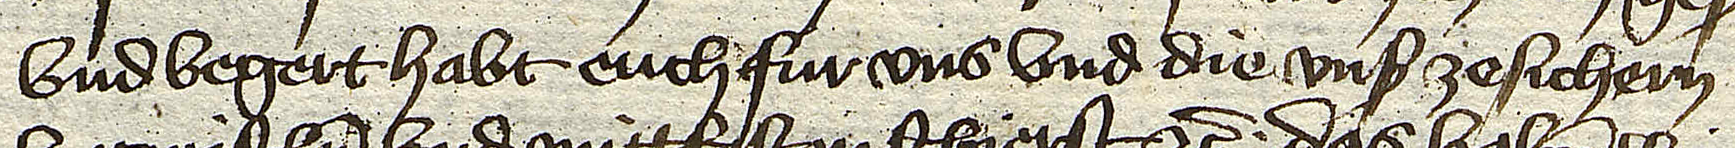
vnd begert habt euch für vns vnd die vnſ* ʒeſichern
